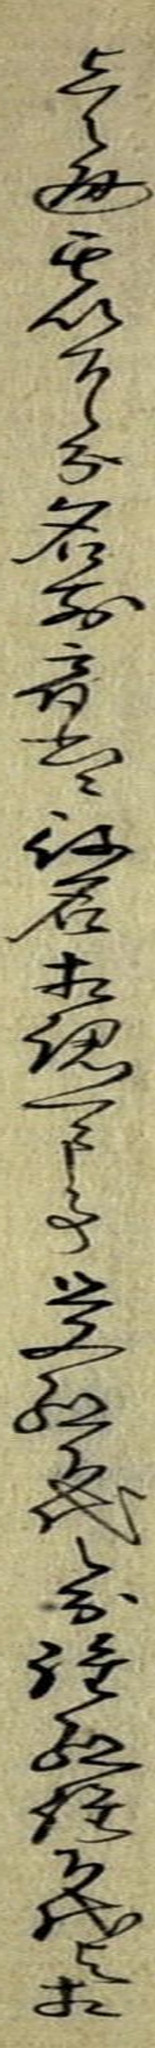迄之通其以下之分名前肩書に役名相認可申事且又組下代之分誰組誰下代と相
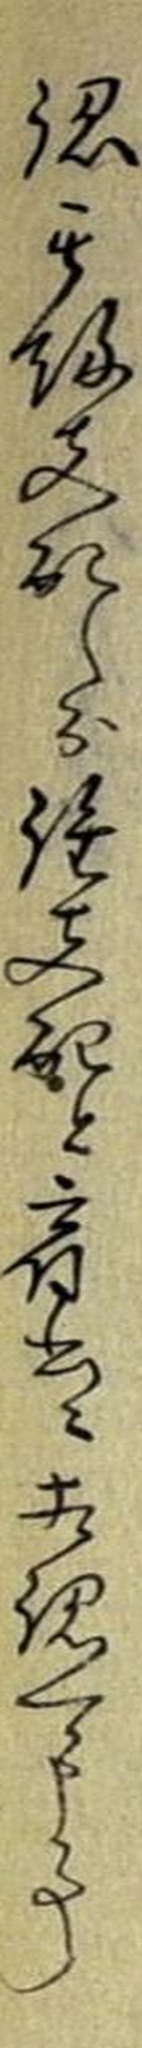認其餘支配之分誰支配と肩書に相認可申事
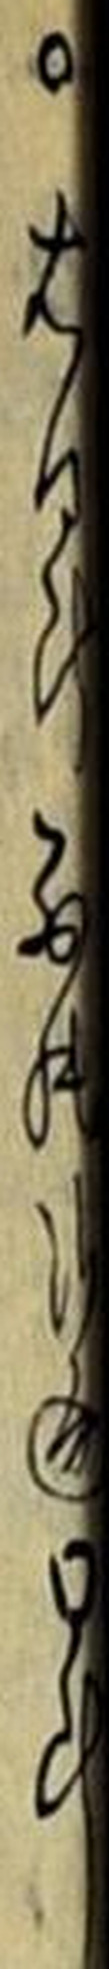○右同断別紙弐通同断
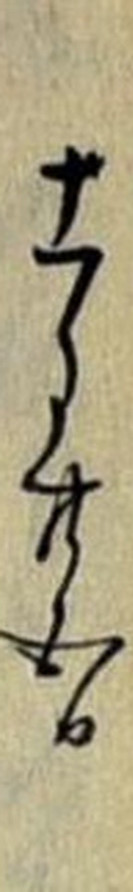十一月廿五日
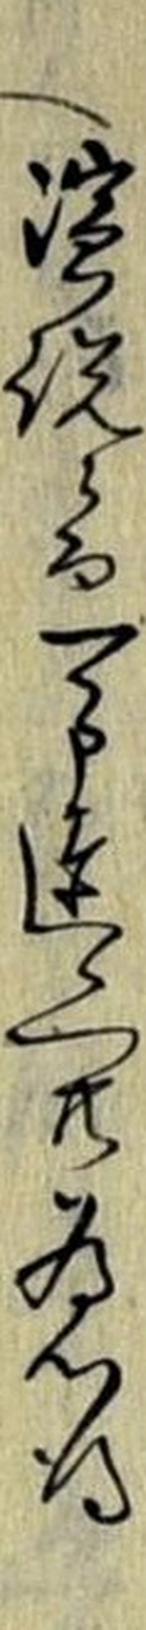演説に而可申達候へ共為心得
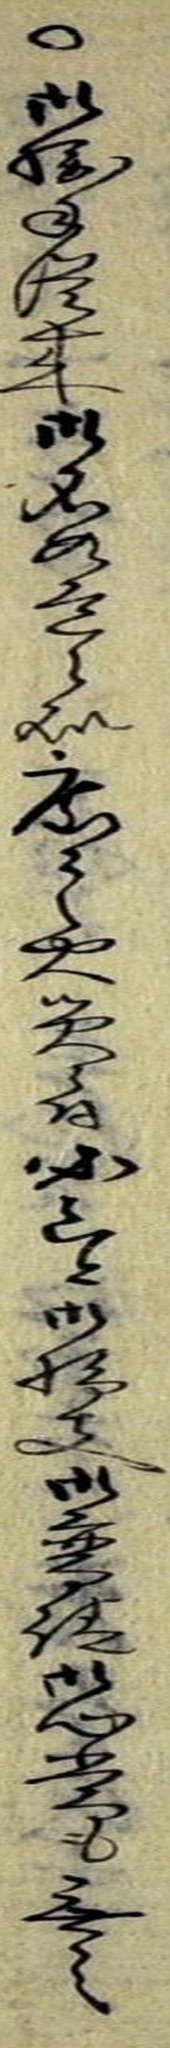○御勝手従來御不如意之処度々之火災に付必至に御指支御普請御心当も無之
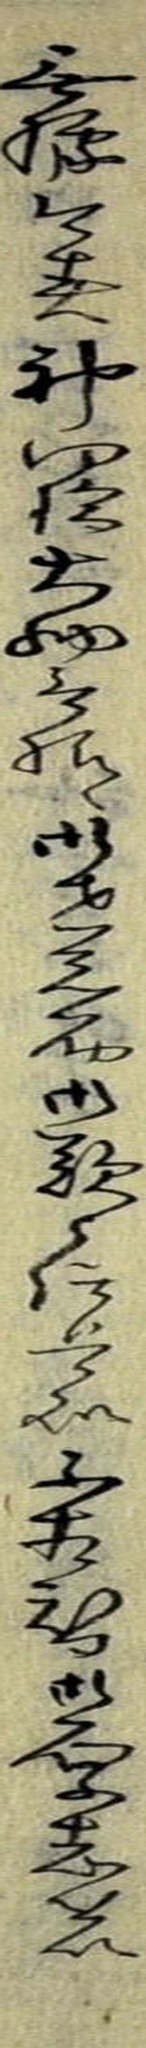無拠今春神田橋大納言様へ御才覚筋御歎被仰上候処不相替御厚志を以
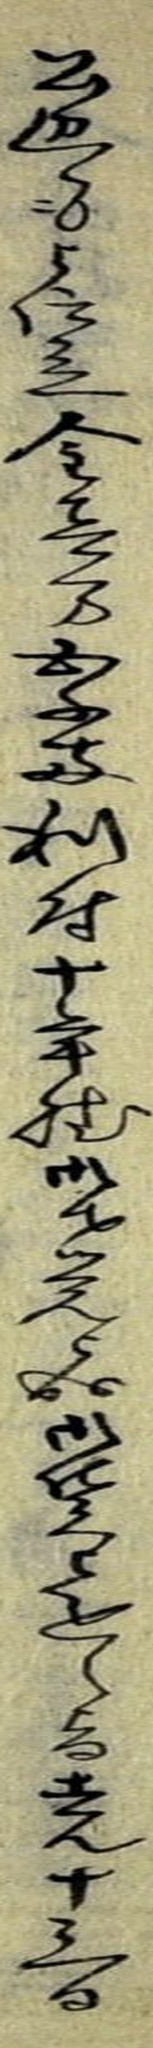公辺へも被仰立金壱万五千両利付十年賦御才覚被成御貸被進之旨去ル十三日
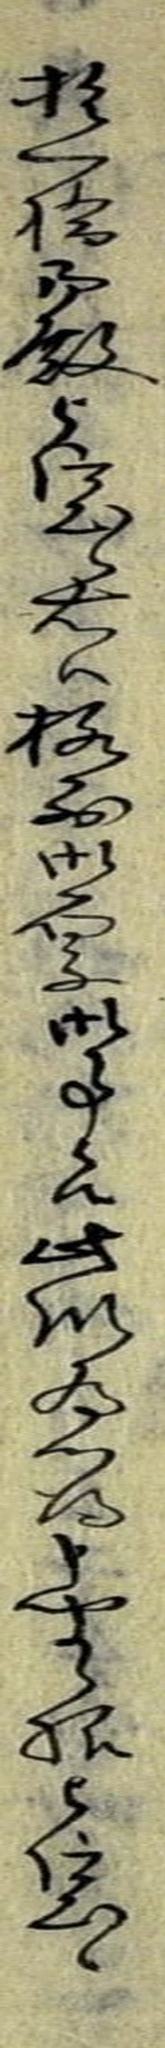於一橋御殿被仰出候右は格別御厚御事に候此段為心得申聞候様被仰出候
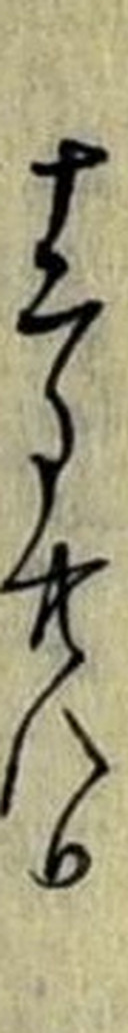十二月廿八日

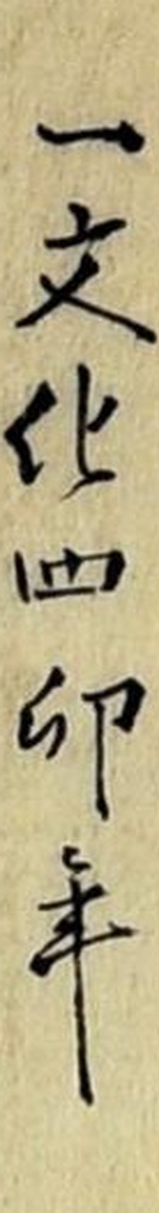一文化四卯年
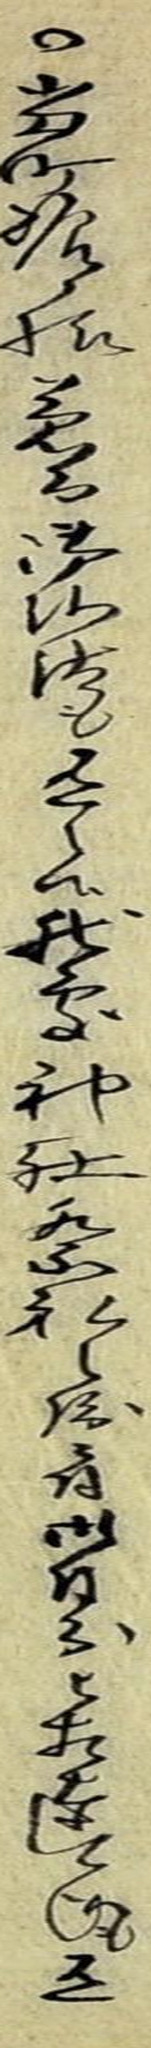○当町賑候様兼而御沙汰も有之候然処神社祭礼之儀に付御自分被相達候趣も有
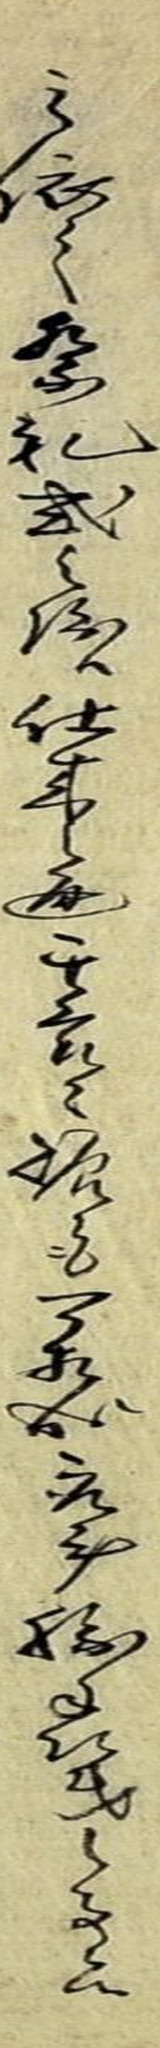之依之祭礼式之儀は仕来候通其節々賑にも可相成取斗勝手次第之事に候
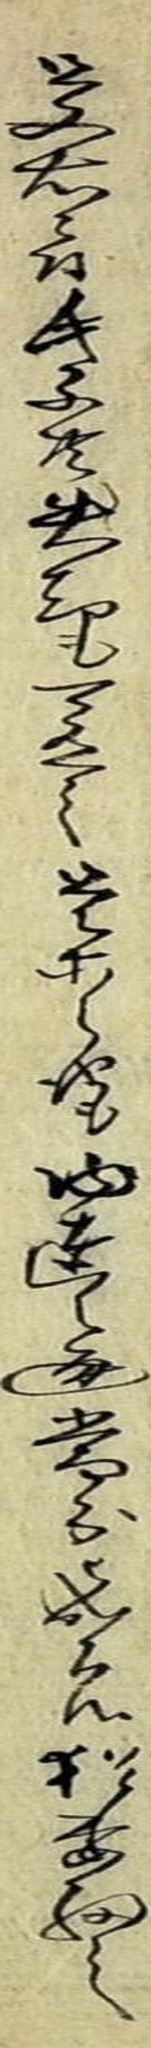且又右に付氏子共失却も可有之是等之儀も内達之通当分被成下候猶委細之
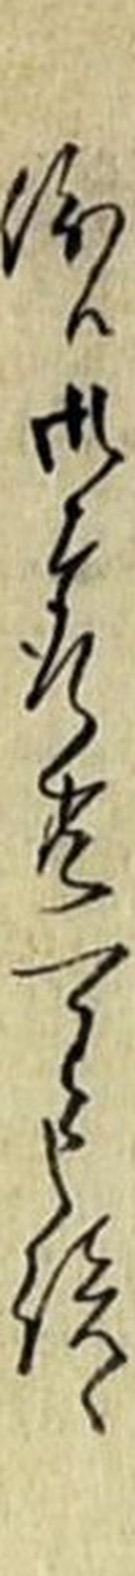儀は御奉行共可被申談候
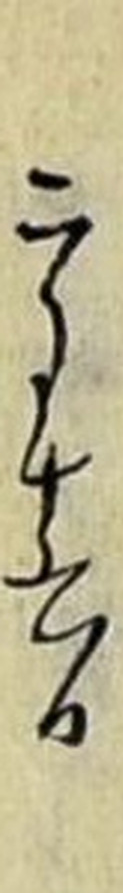二月十六日
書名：命令之部 四
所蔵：福井県文書館 Fukui Prefectural Archives
